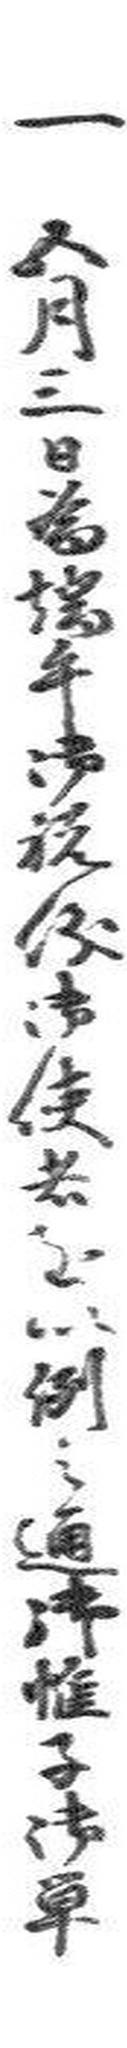一五月三日え為端午御祝儀御使者を以例之通御帷子御単
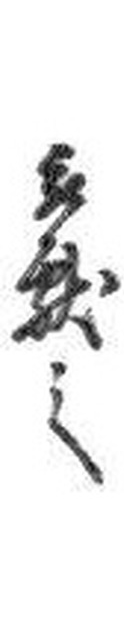被献之
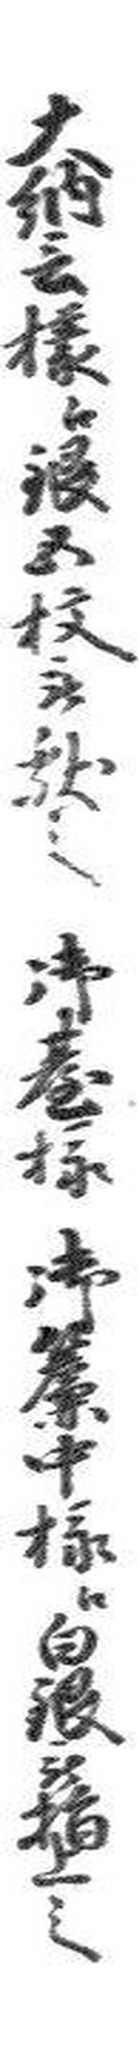大納言様江銀五枚被献之御台様御簾中様江白銀被指上之
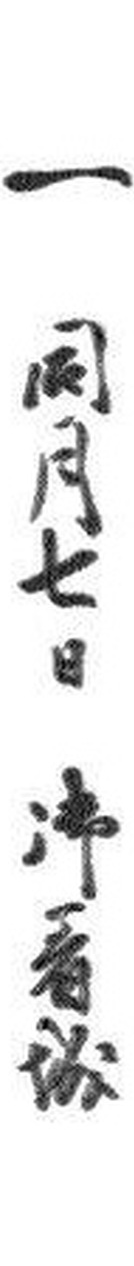一同月七日御着城
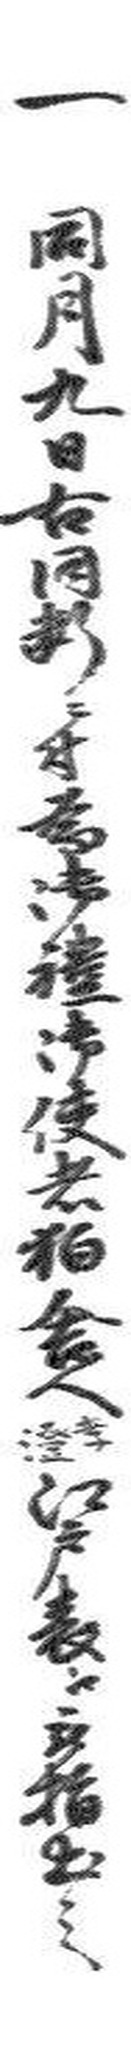一同月九日右同断ニ付為御礼御使者狛舎人孝澄江戸表江被指出之

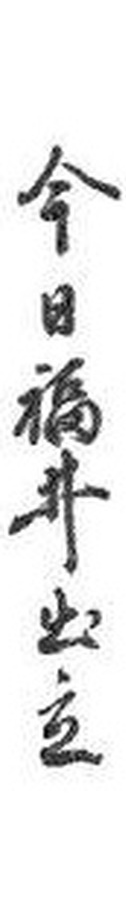今日福井出立
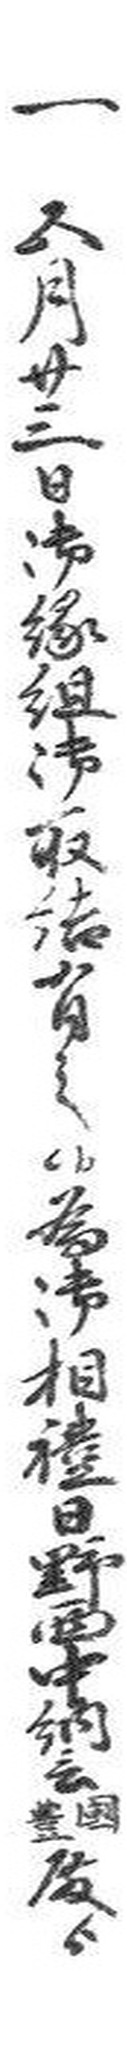一五月廿三日御縁組御取結有之候為御相礼日野西中納言国豊殿ゟ
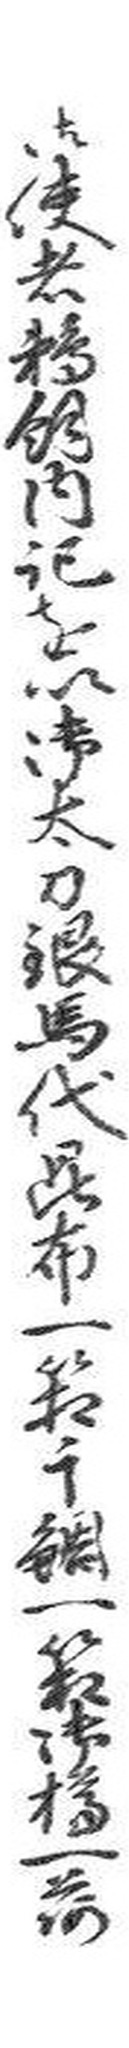御使者鵜飼内記を以御太刀銀馬代昆布一箱干鯛一箱御樽一荷
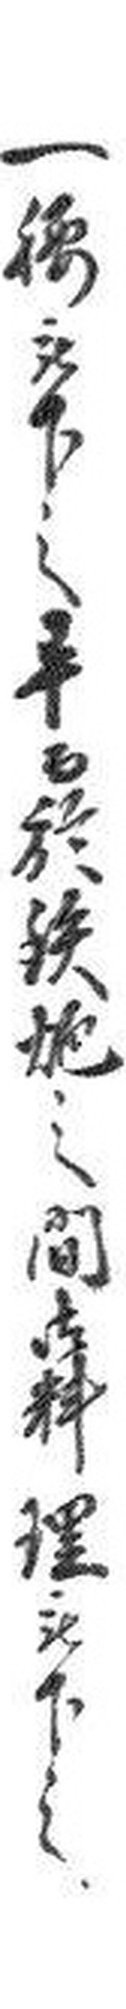一腰被下之畢而於鉄炮之間御料理被下之
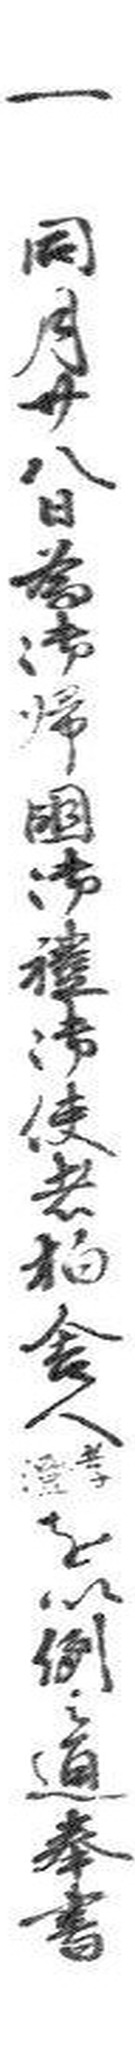一同月廿八日為御帰国御礼御使者狛舎人孝澄を以例之通奉書
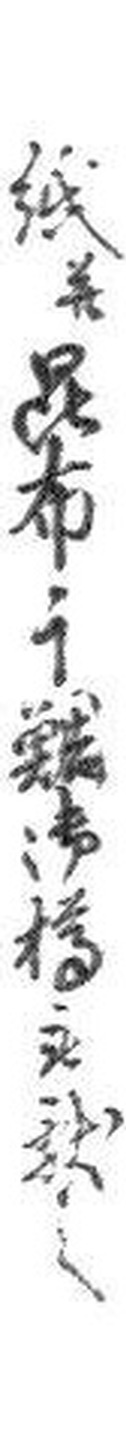紙并昆布干鯛御樽被献之
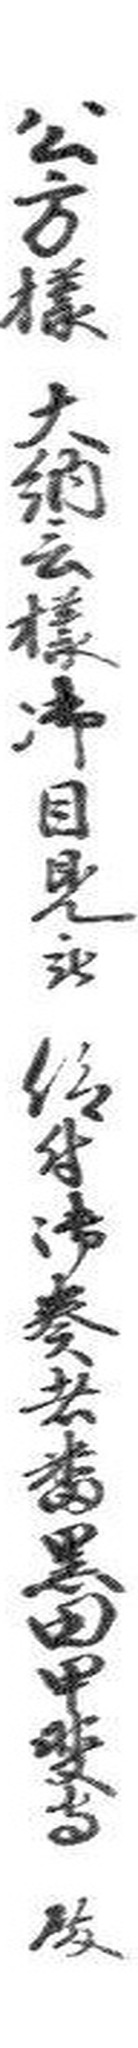公方様大納言様御目見被仰付御奏者番黒田甲斐守殿
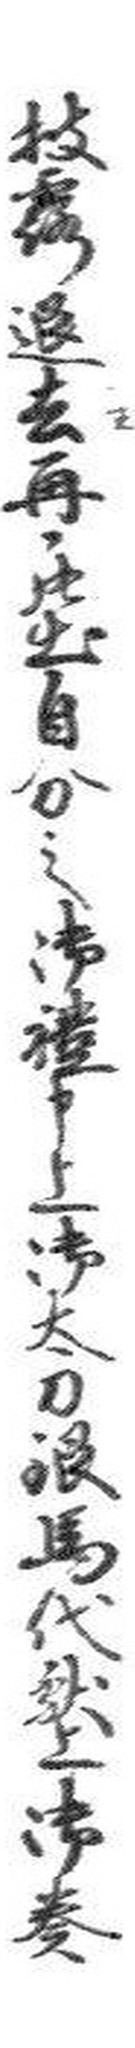披露退去再罷出自分之御礼申上御太刀銀馬代献上御奏
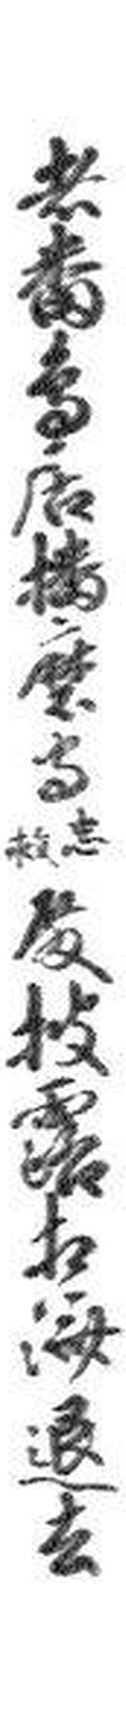者番鳥居播磨守忠救殿披露相済退去
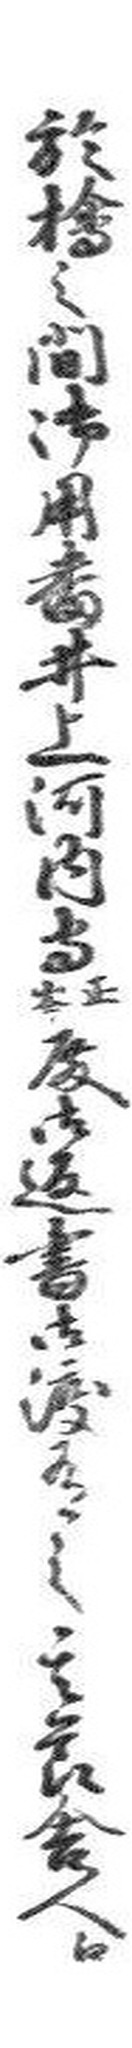於桧之間御用番井上河内守正岑殿御返書御渡有之其節舎人江
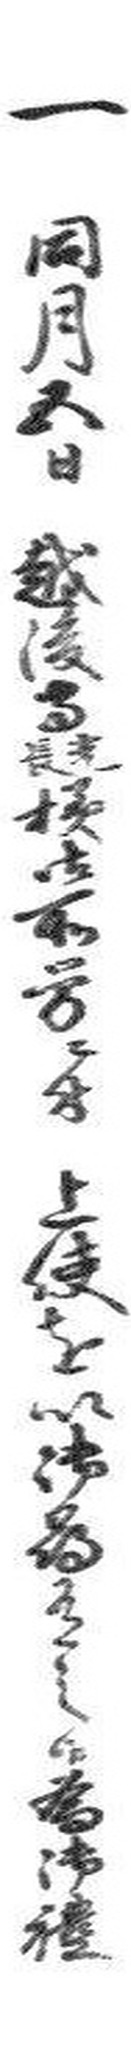一同月五日越後守光長様御所労ニ付上使を以御尋有之候為御礼
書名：家譜 二十四 吉品公 従宝永三年到同五年
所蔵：福井県文書館 Fukui Prefectural Archives
